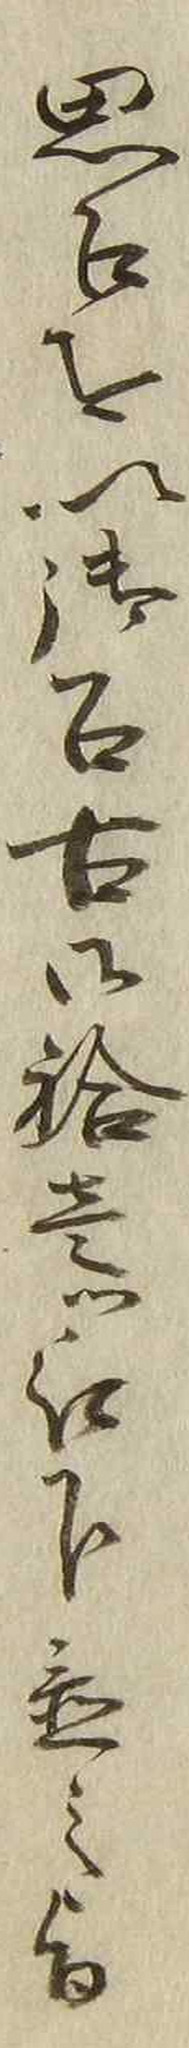思召を以御召古御袷壱ツ被下置之旨
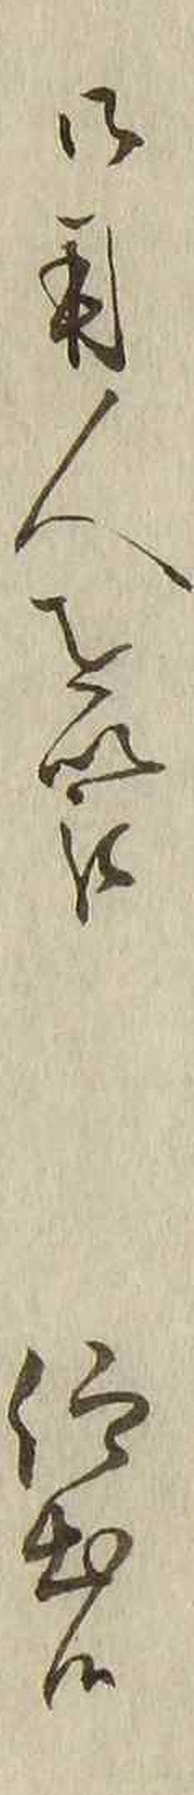御用人を以被仰出候
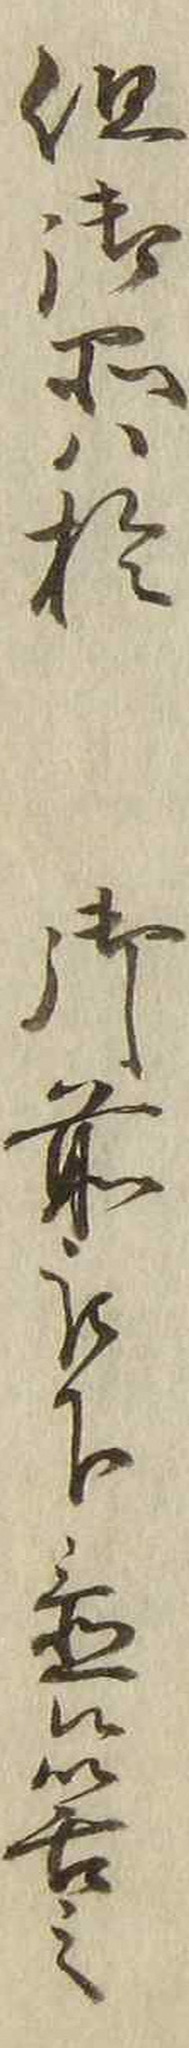但御品ハ於御前被下置候筈之

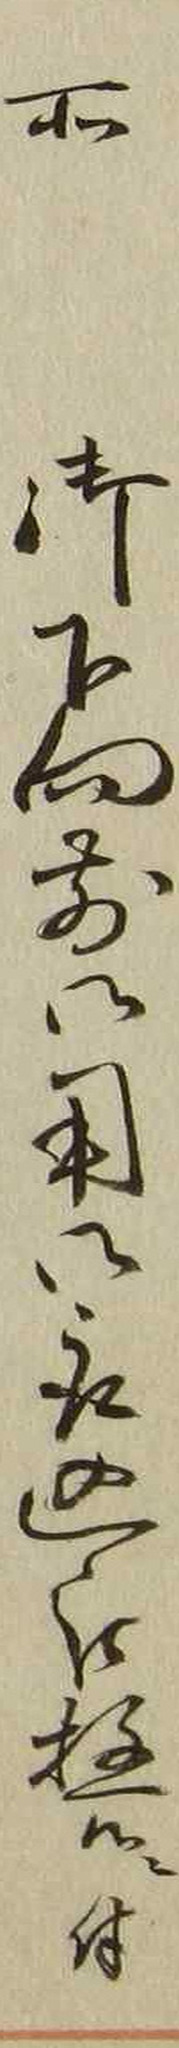所御下向前御用御取込被遊候ニ付
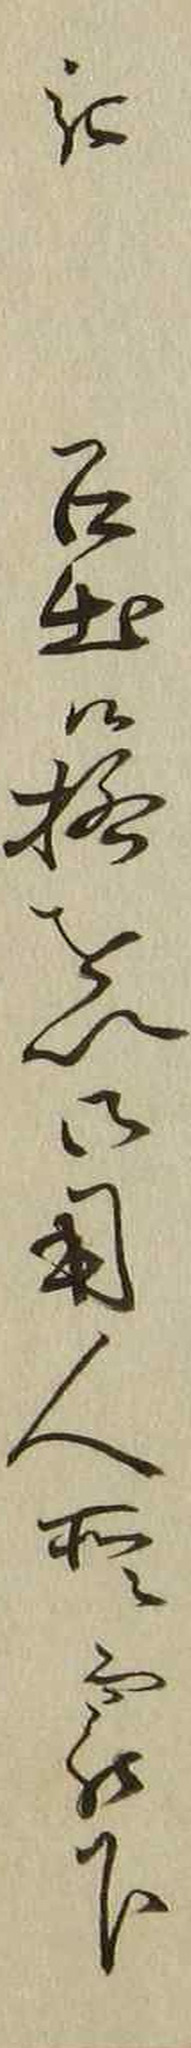被召出候格を以御用人所ニ而被下
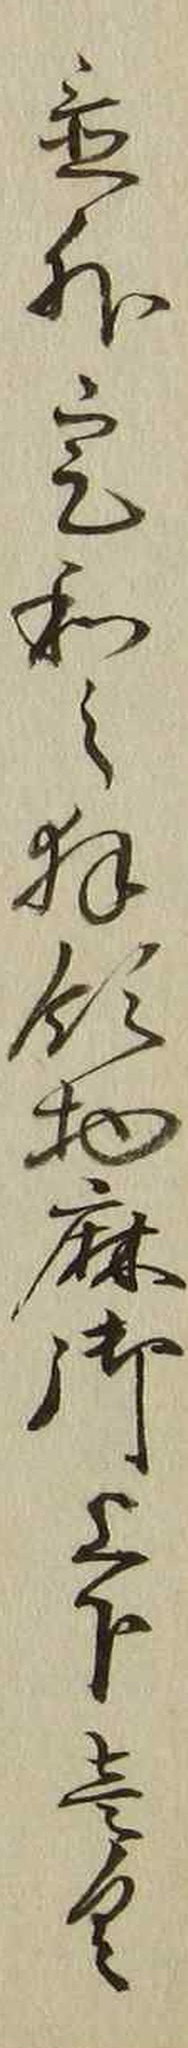置外定和之拝領物麻御上下壱具
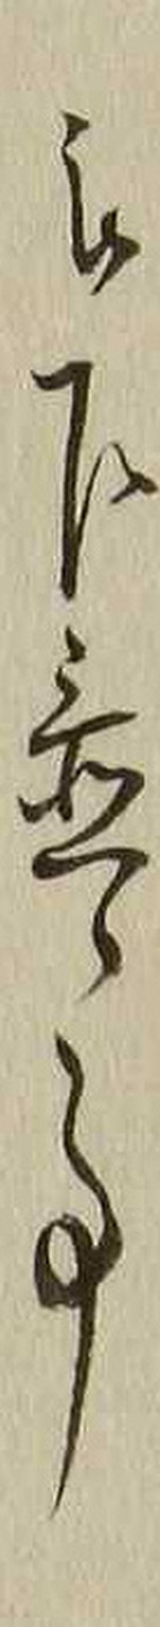被下置候事
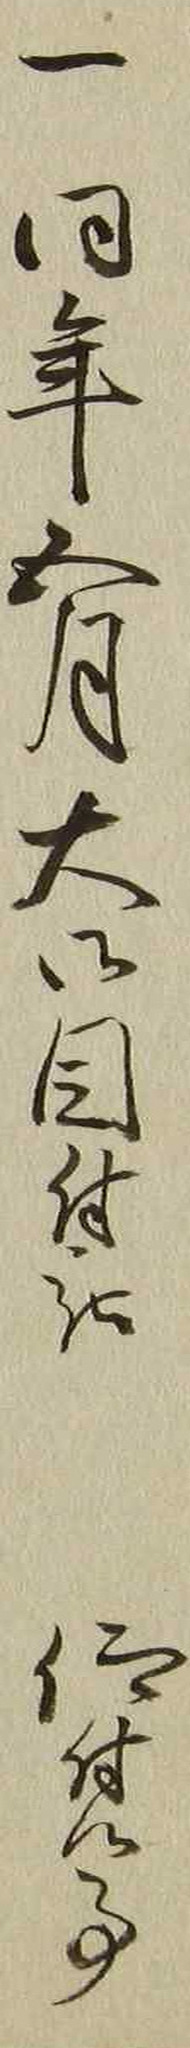一同年五月大御目付被仰付候事
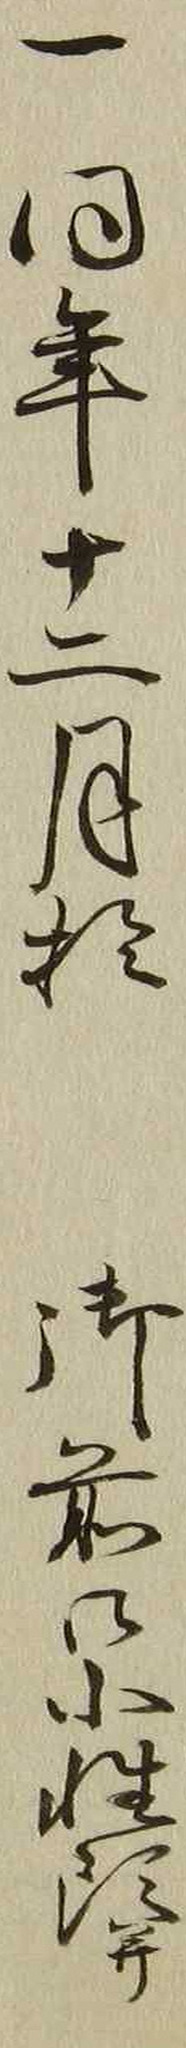一同年十二月於御前御小性頭幷
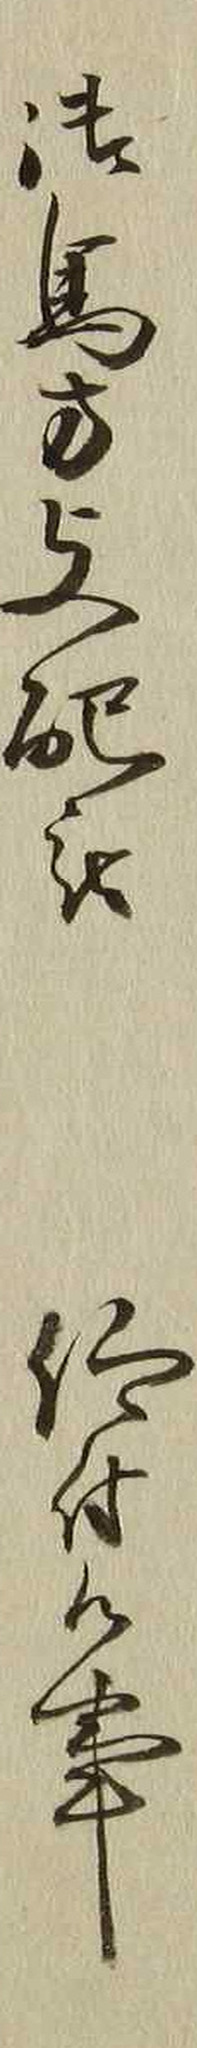御馬方支配被仰付候事
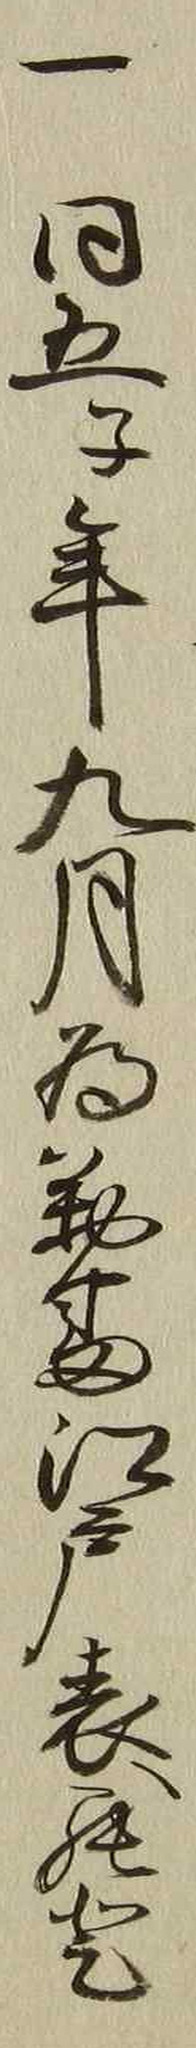一同五子年九月為勤番江戸表へ罷登
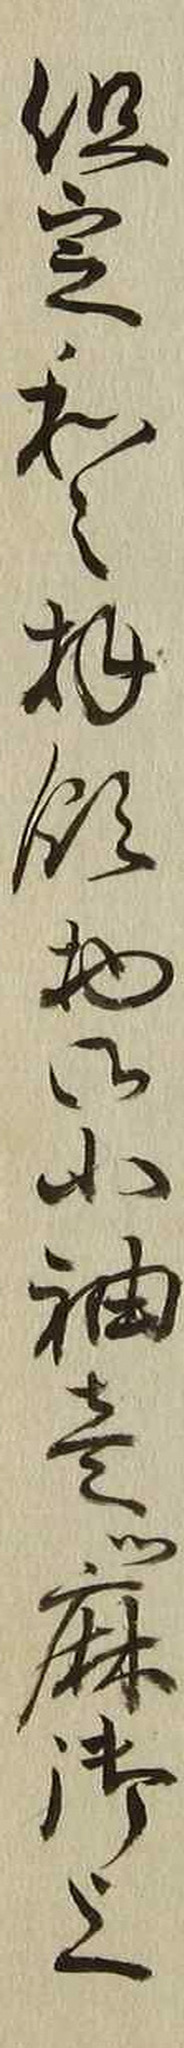但定和之拝領物小袖壱ツ麻御上
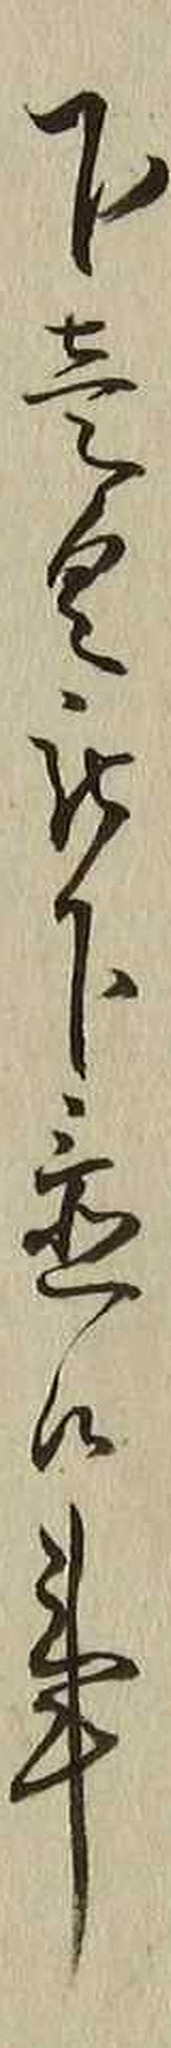下壱具被下置候事
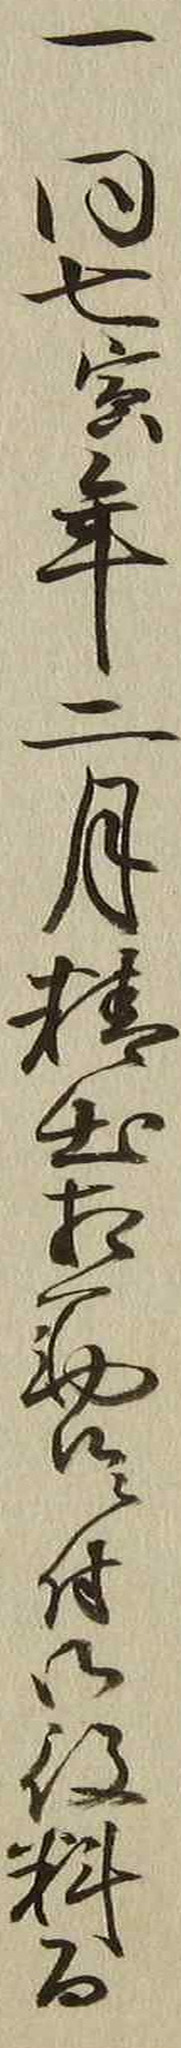一同七寅年二月精出相勤候ニ付御役料百
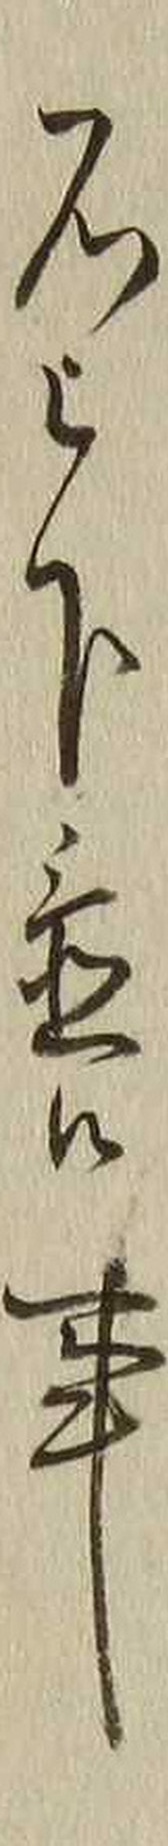石被下置候事
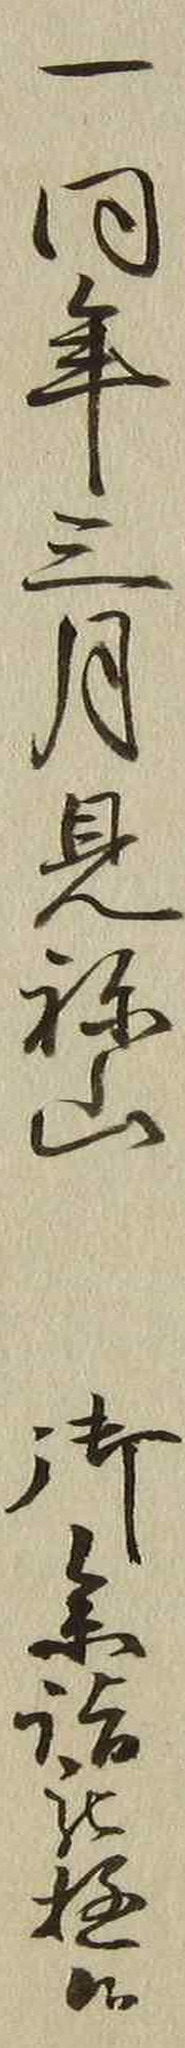一同年三月見祢山御参詣被遊候
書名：諸士系譜　巻之60　と之部3
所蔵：会津若松市立会津図書館
